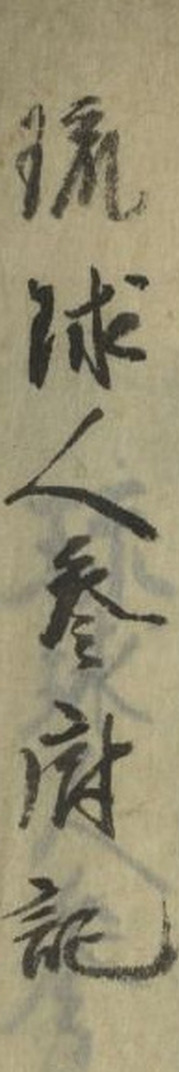琉球人参府

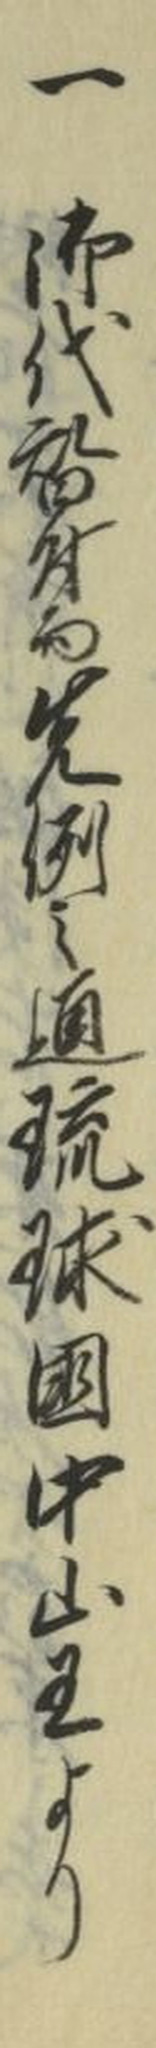一御代替付而先例之通琉球国中山王より
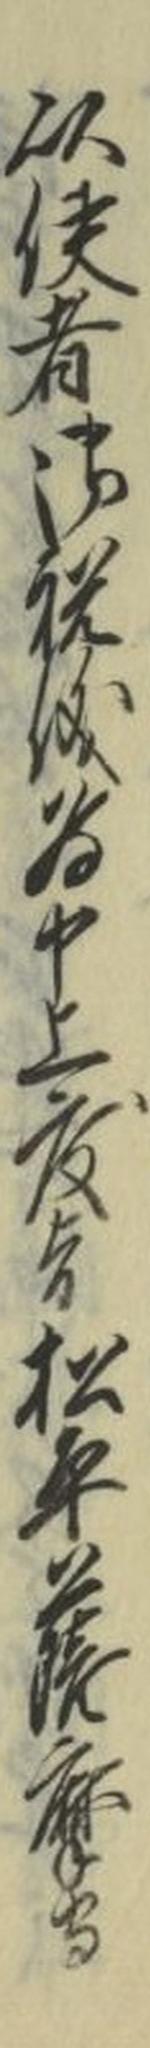以使者御祝儀為申上度旨松平薩摩守
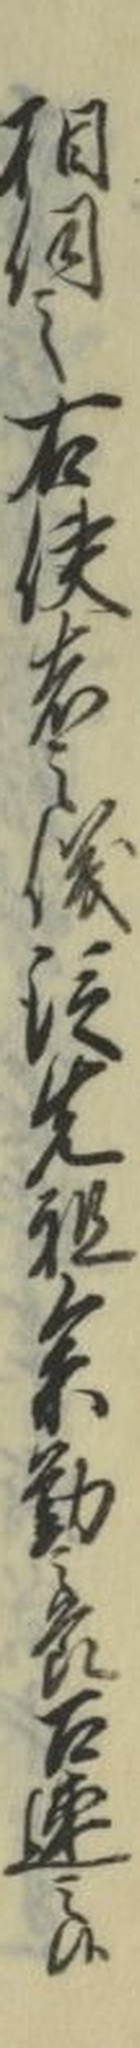相伺之右使者之儀従先祖参勤之節召連之候
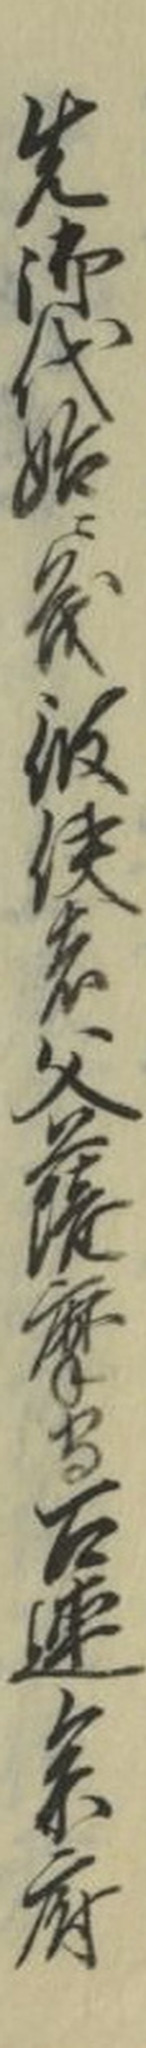先御代始ニも彼使者父薩摩守召連参府
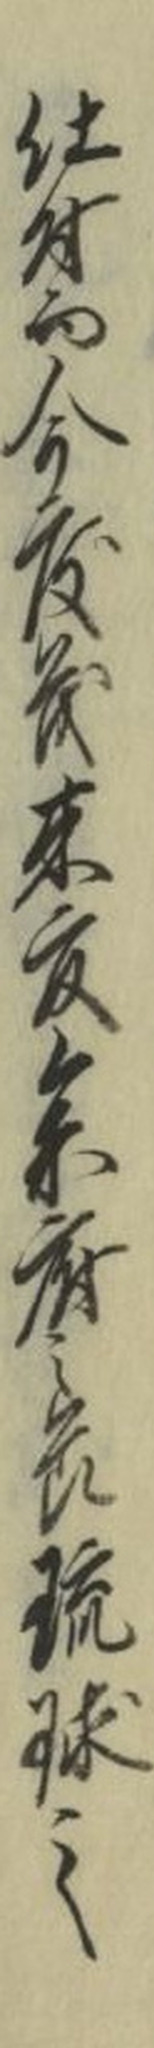仕付而今度も来夏参府之節琉球之
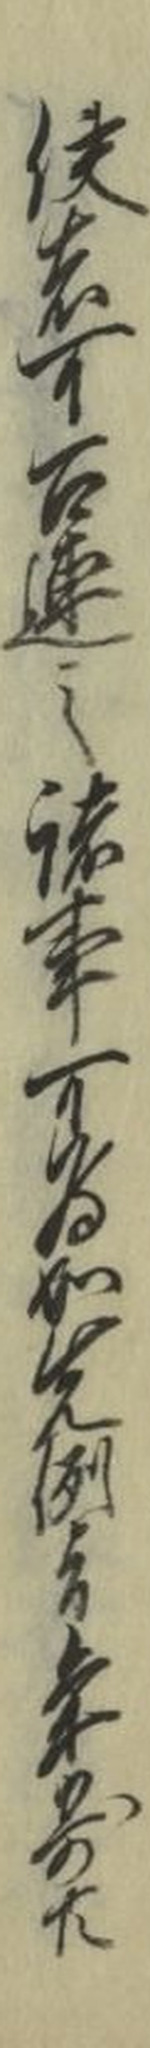使者可召連之諸事可為如先例旨年寄共

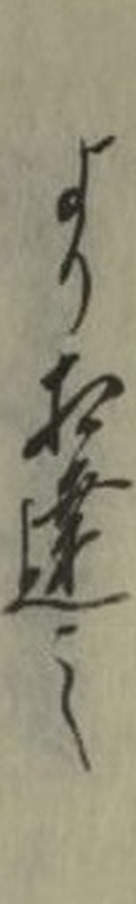より相達之
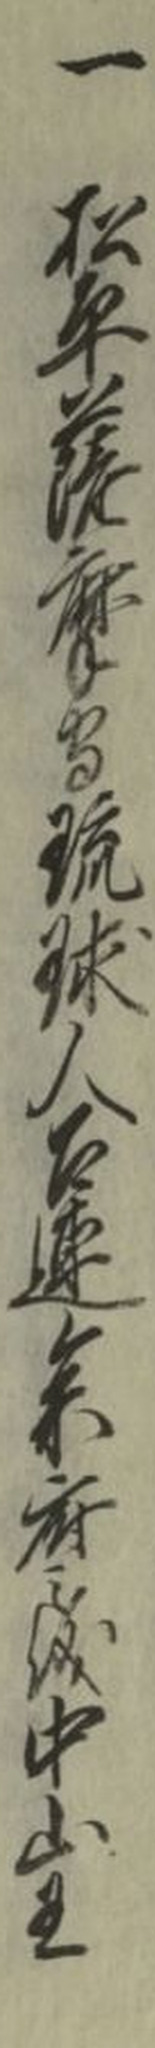一松平薩摩守琉球人召連参府之儀中山王
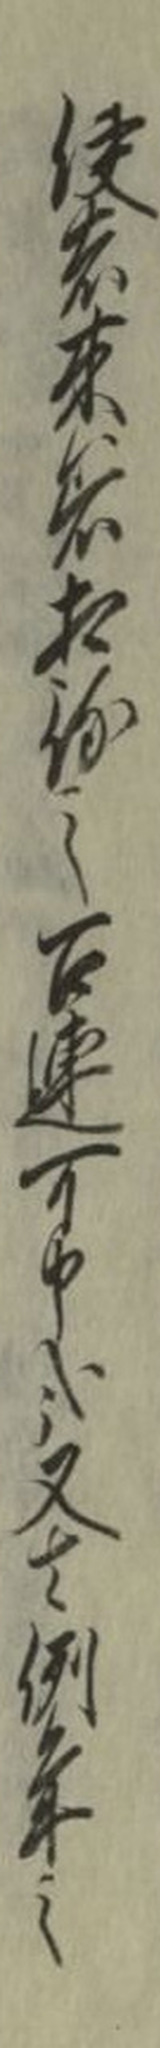使者来着相縁之召連可申哉又は例年之
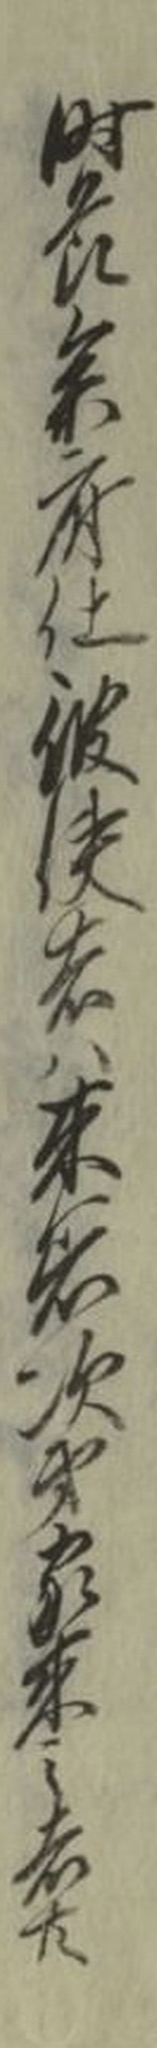時節参府仕彼使者ハ来着次第家来之者共
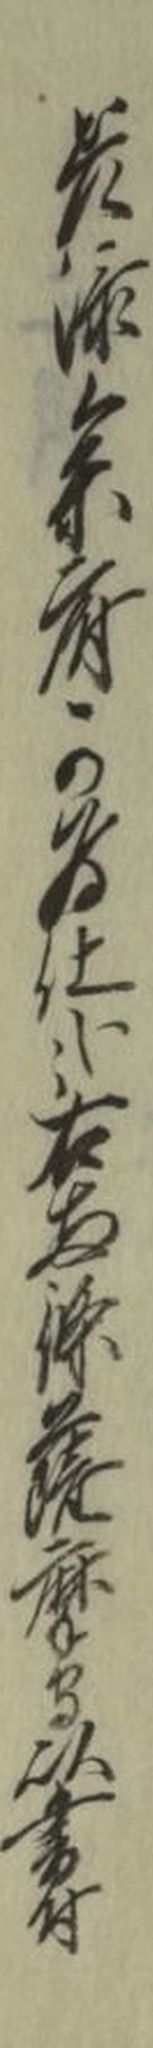差添参府可為仕哉右両條薩摩守以書付
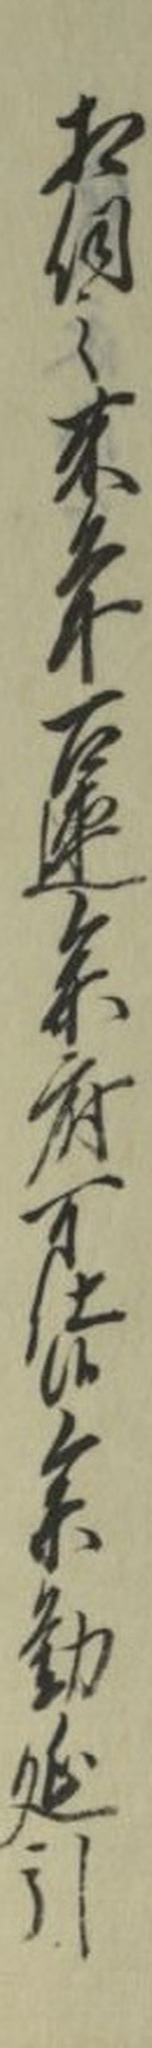相伺之家来召連参府可仕候参勤延引
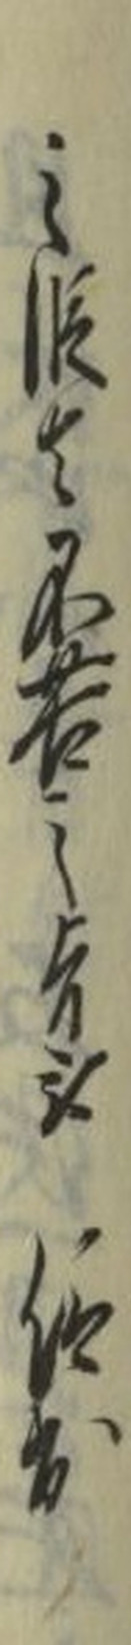之段は不苦之旨被仰出
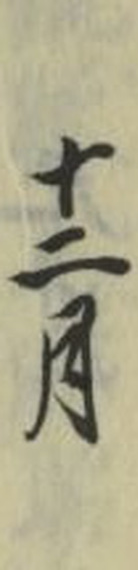十二月
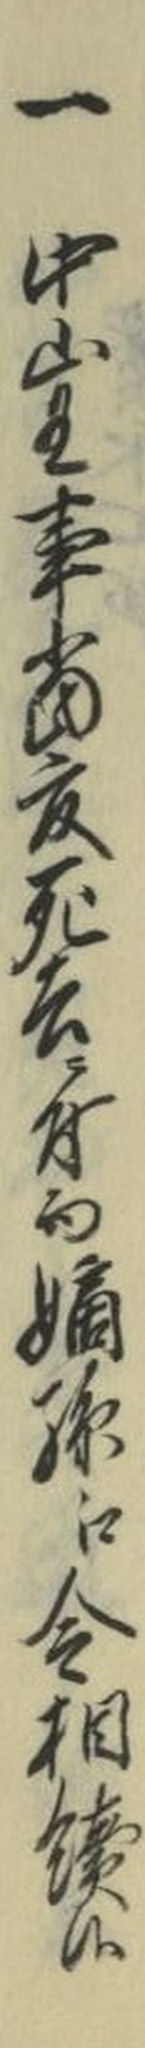一中山王事当夏死去二付而嫡孫え令相続候
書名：琉球人参府記
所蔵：University of the Ryukyus Library
